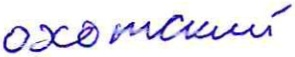охотский
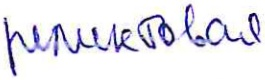реликтовая
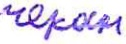чекан
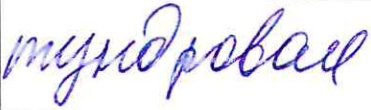тундровая
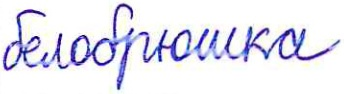белобрюшка
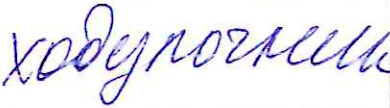ходулочник
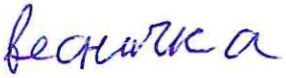весничка
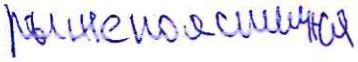рыжепоясничная
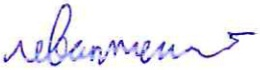левантский
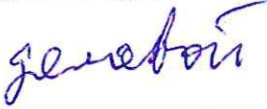домевой
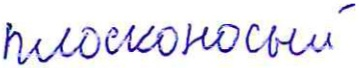плосконосый
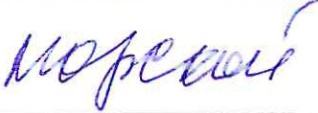морской
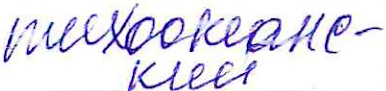тихоокеанс-кий
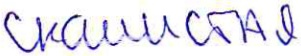скалистая
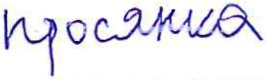просянка
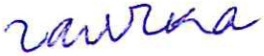гаичка
